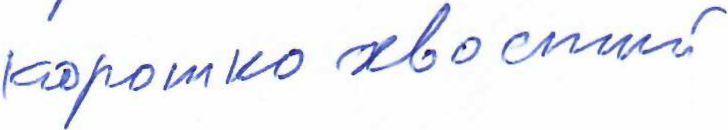коротко хвостый
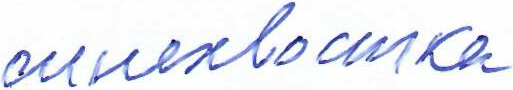синехвостка
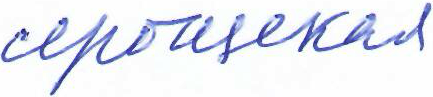серощекая
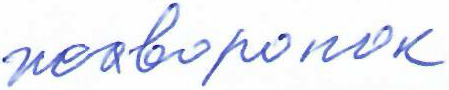жаворонок
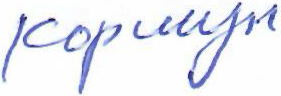коршун
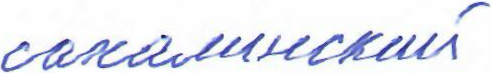сахалинский
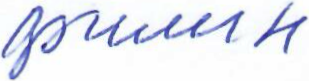филин
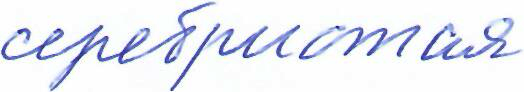серебристая
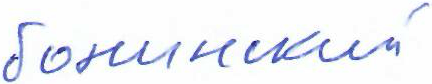бонинский
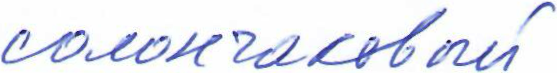солончаковый
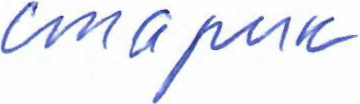старик
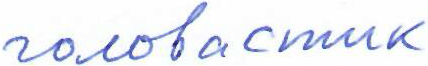головастик
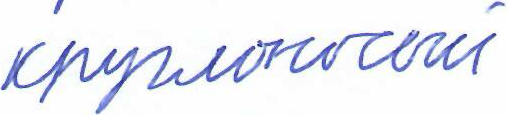круглоносый
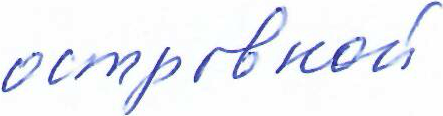островной
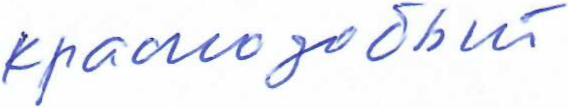краснозобый
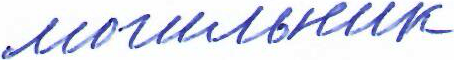могильник
